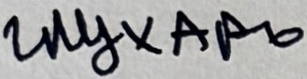глухарь
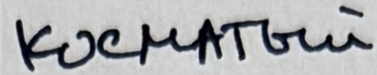косматый
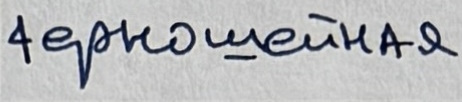черношейная
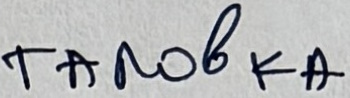таловка
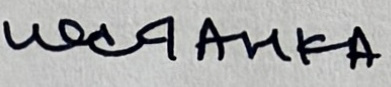песчанка
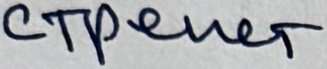стрепет
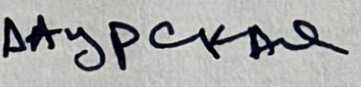даурская
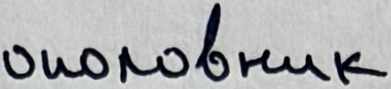ополовник
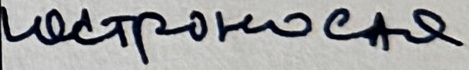пестроносая
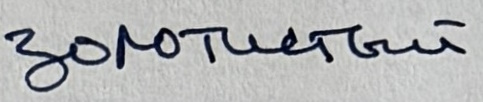золотистый
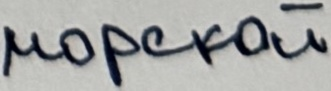морской
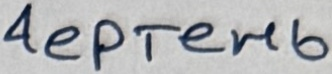чертень
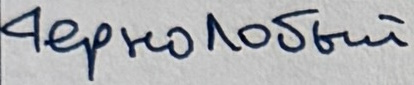чернолобый
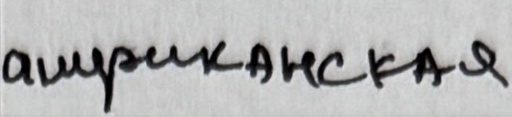амриканская
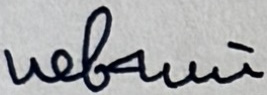певчий
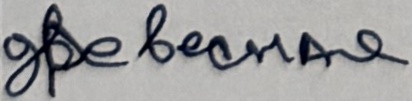древесная
